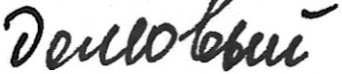домовый
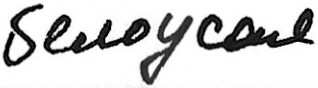белоусая
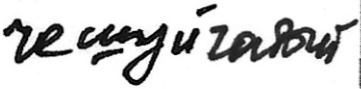чешуйчатый
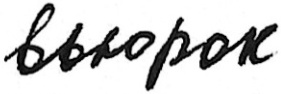вьюрок
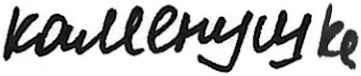каменушка
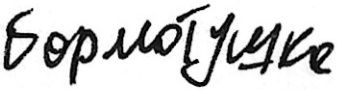бормотушка
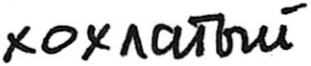хохлатый
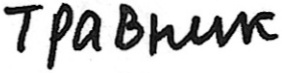травник
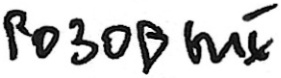розовый
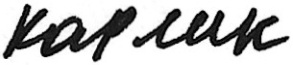карлик
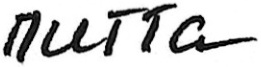питта
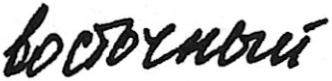восточный
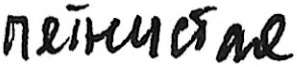пятнистая
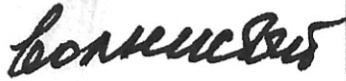волнистый
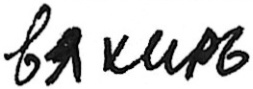вяхирь
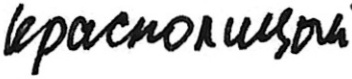краснолицый
